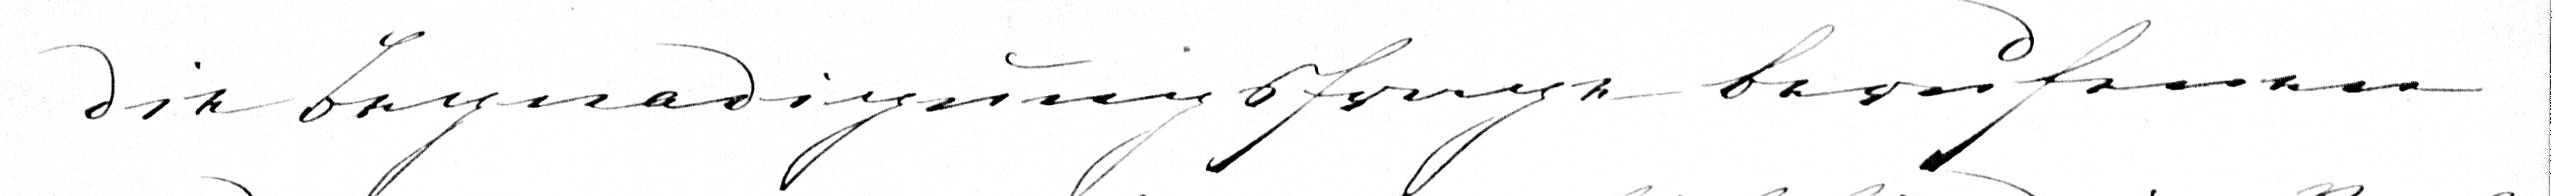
die Begnadigungsfrage berufenen
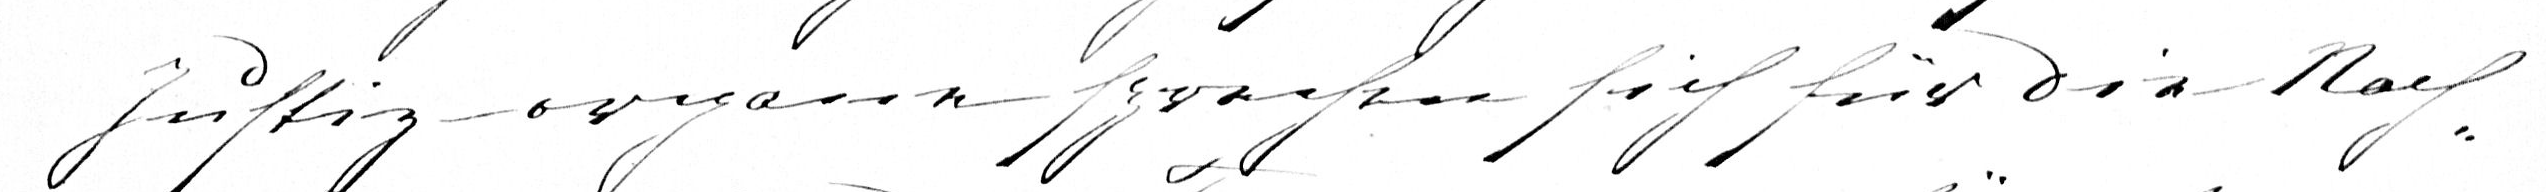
Justiz organe sprechen sich für die Nach¬
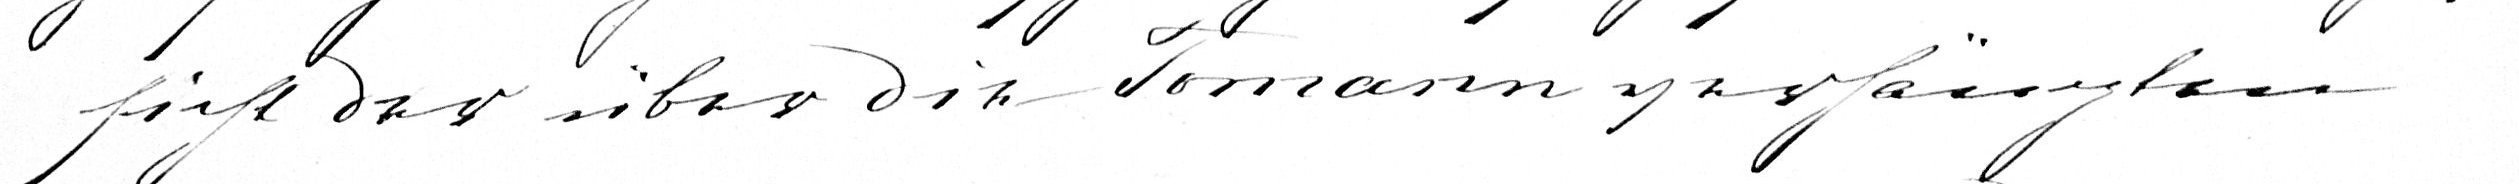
sicht der über die Tomann verhängten
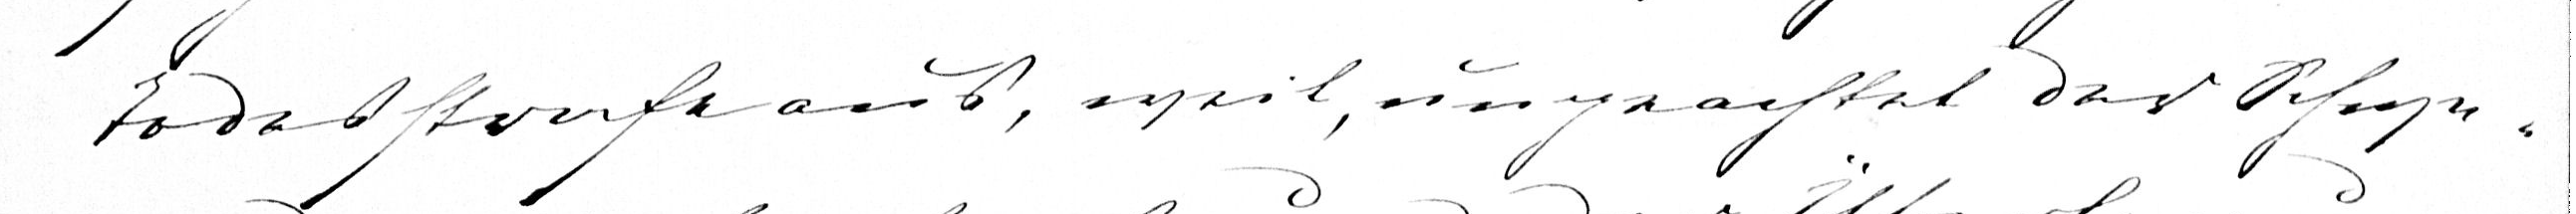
Todesstrafe aus, weil, ungeachtet der Schwe¬
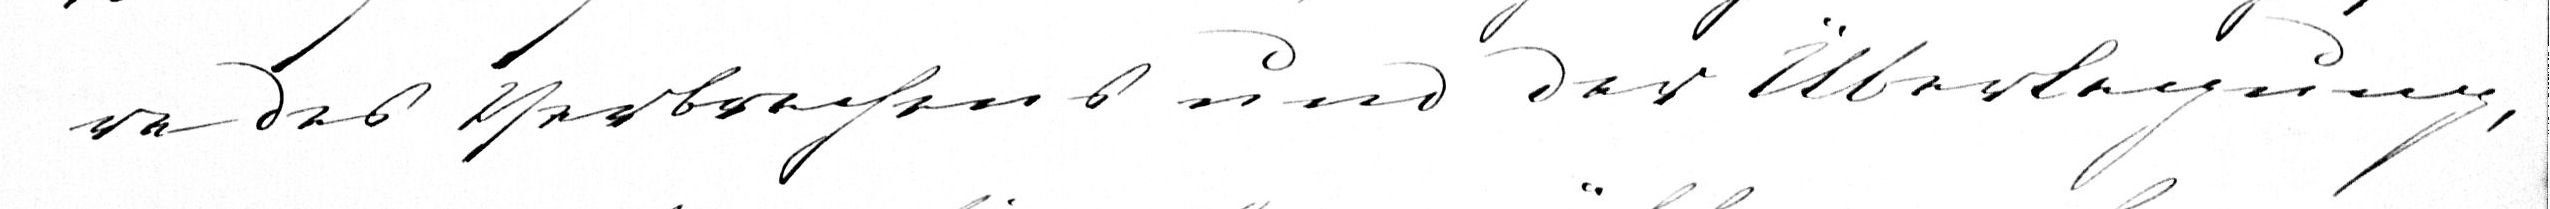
re des Verbrechens und der Überlegung,
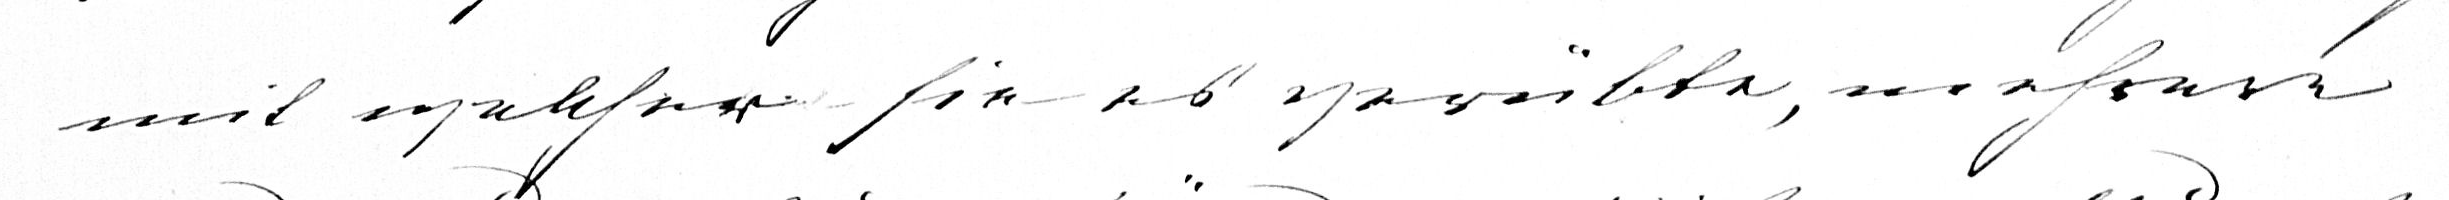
mit welcher sie es verübte, mehrere
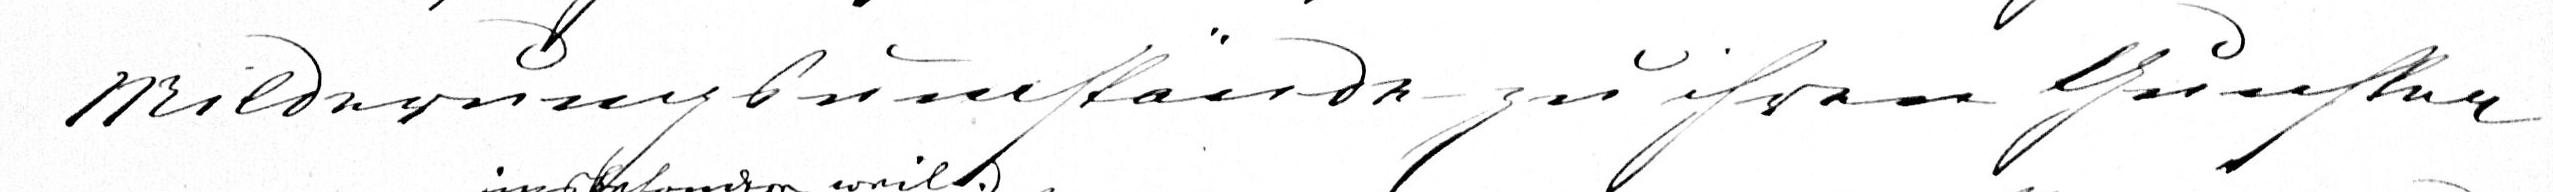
Milderungsumstände zu ihren Gunsten
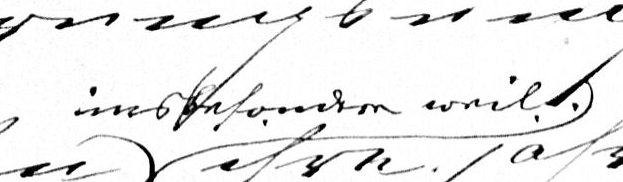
insbesondere weil
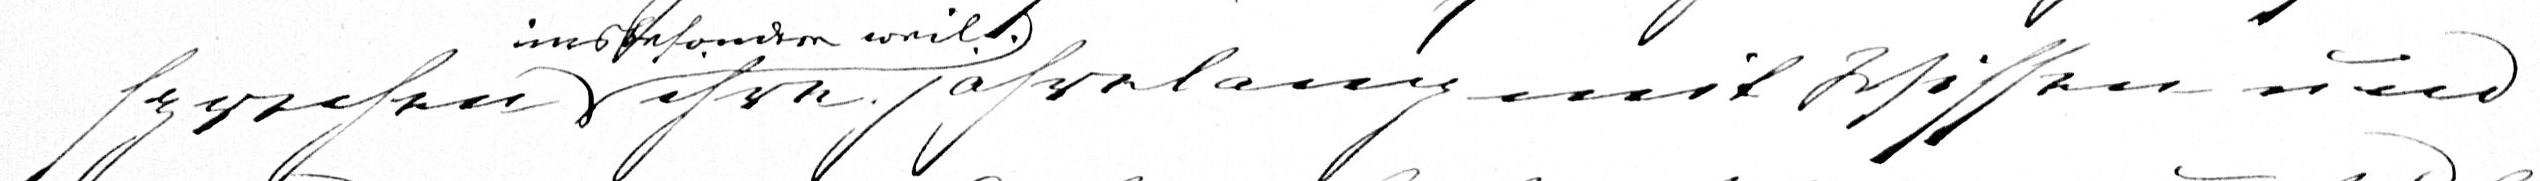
sprechen ihre jahrelang mit Wissen und
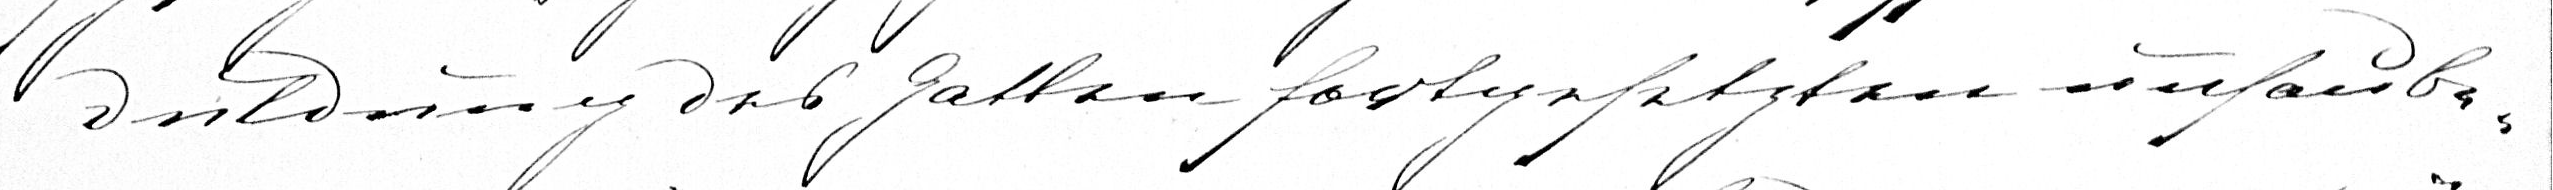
Duldung des Gatten fortgesetzten unsaube¬
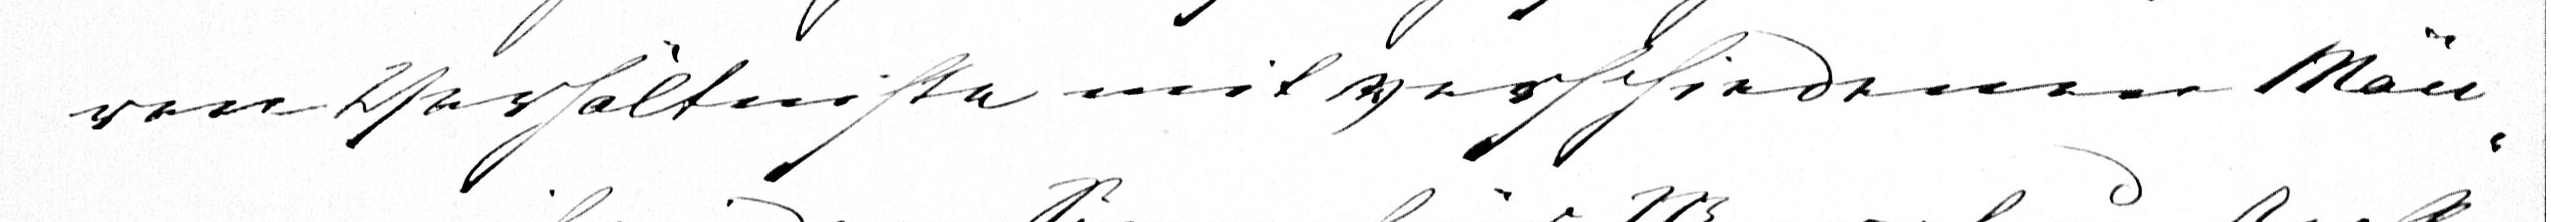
ren Verhältnisse mit verschiedenen Män¬
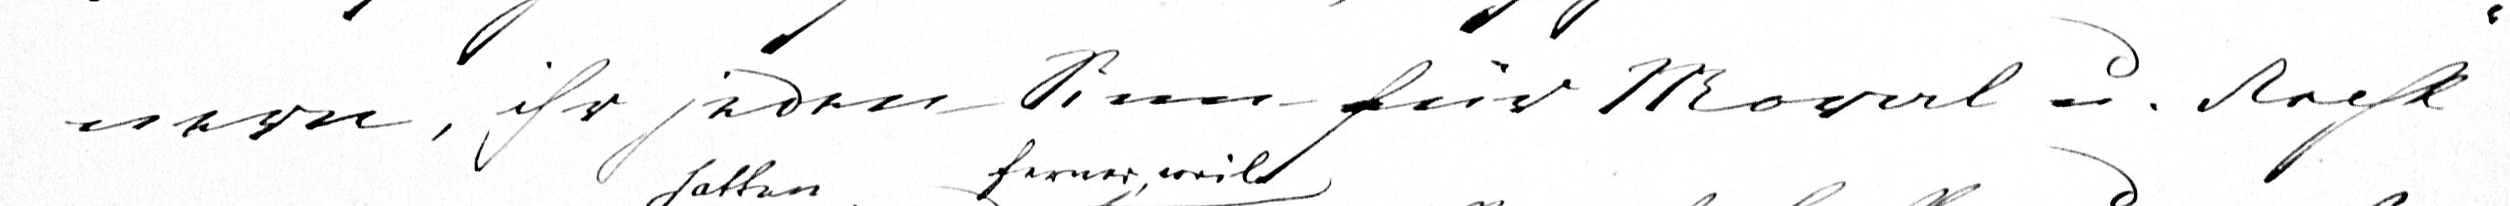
nern, ihr jeden Sinn für Moral u. Recht
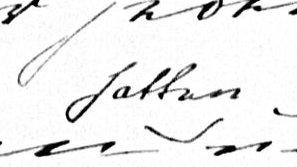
hatten
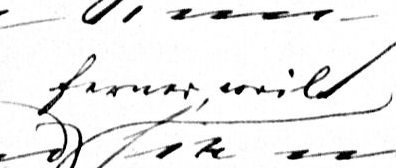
ferner weil
